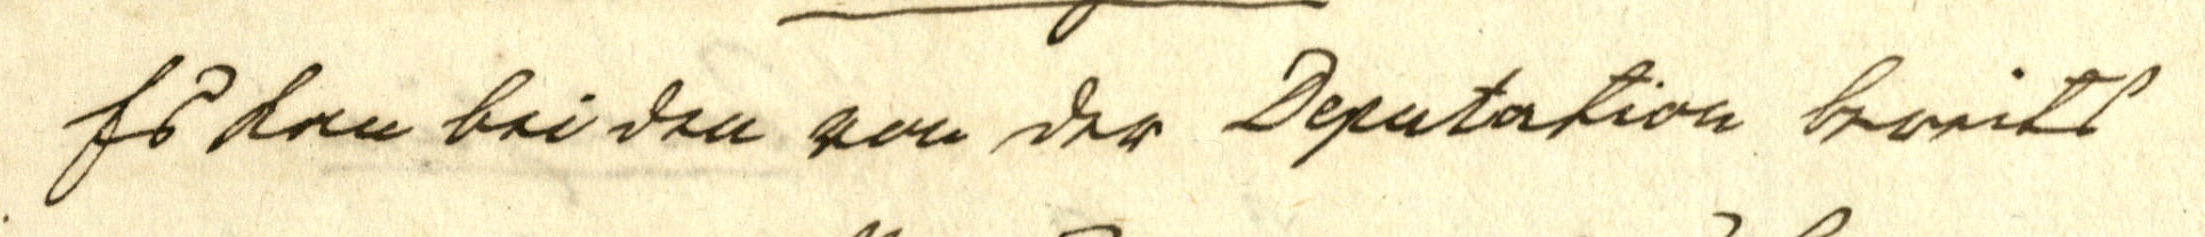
Es kan bei den von der Deputation bereits
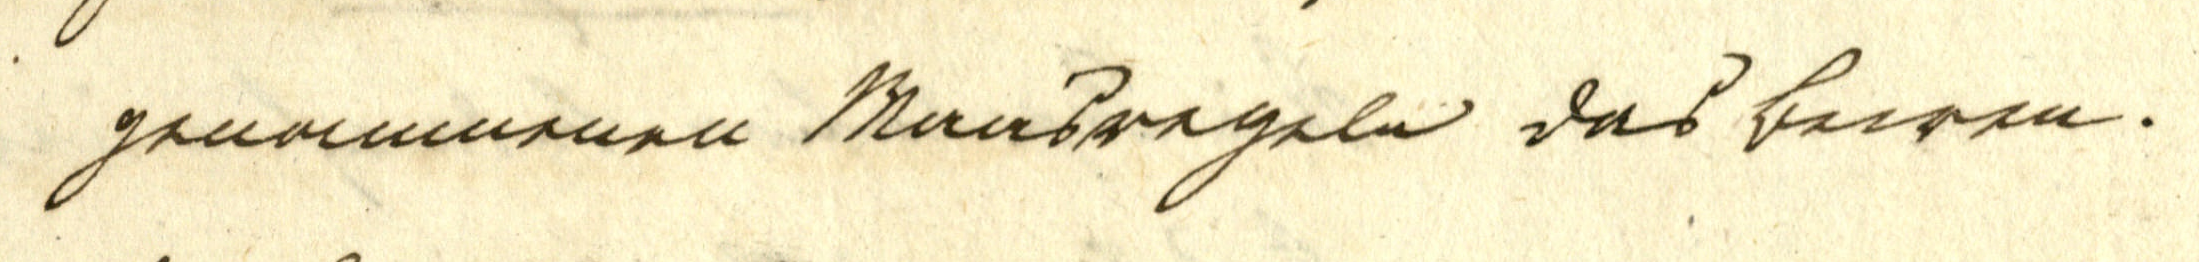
genommenen Maasregeln das Bewen¬
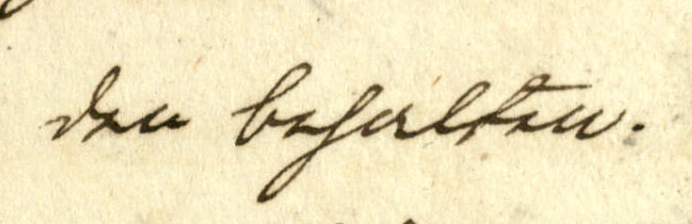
den behalten.
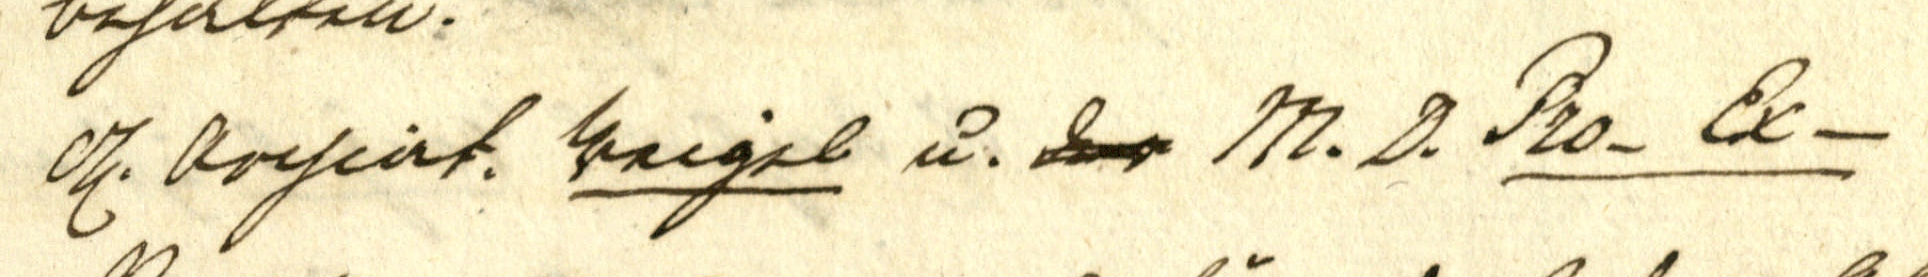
dh. Archiat. Weigel, u. der M. D. Pro. Ex¬
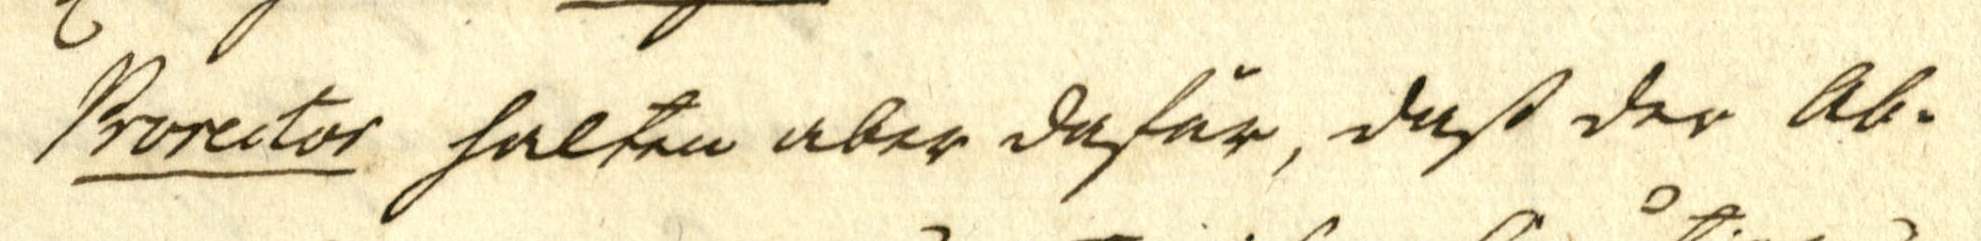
Prorector halten aber dafür, daß der Ab¬
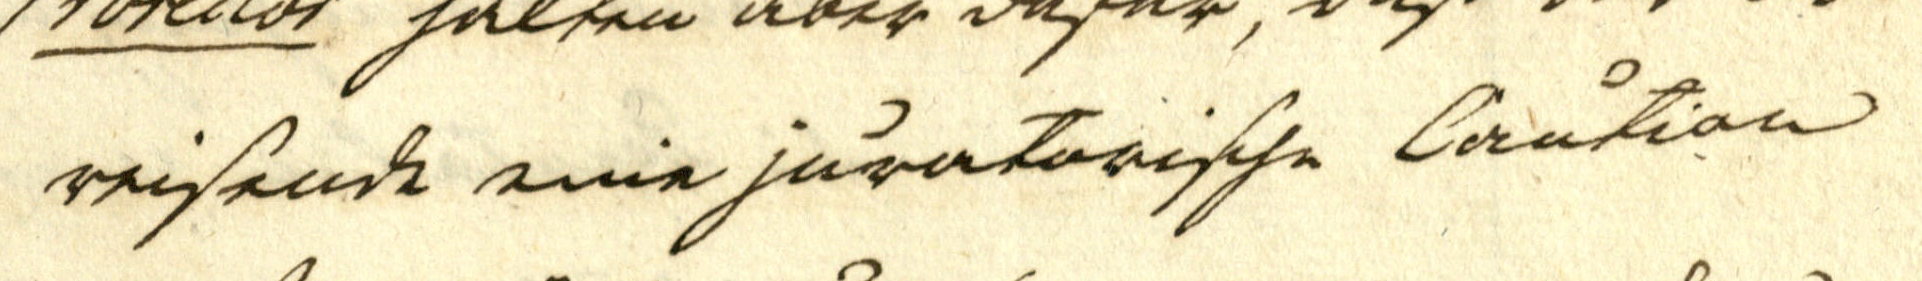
reisende eine juratorische Caution
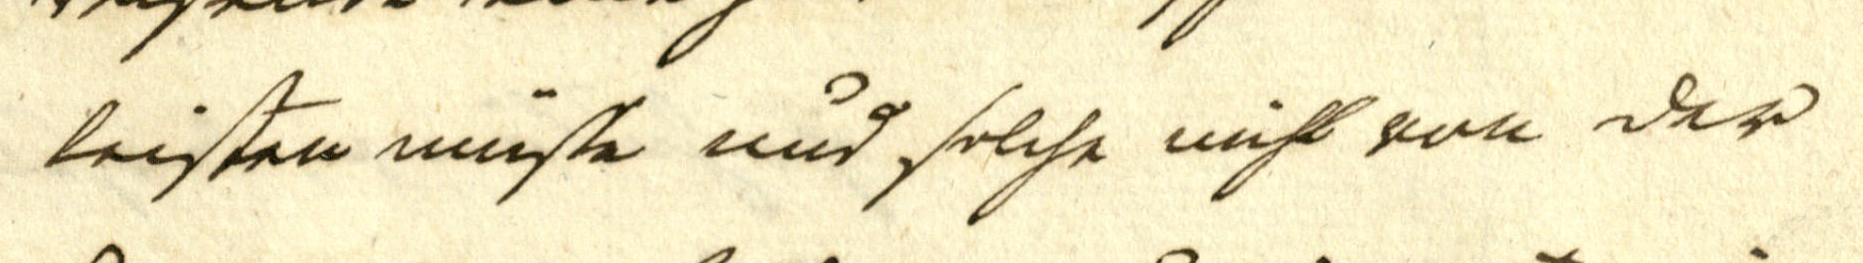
leisten müsse und solche nicht von der
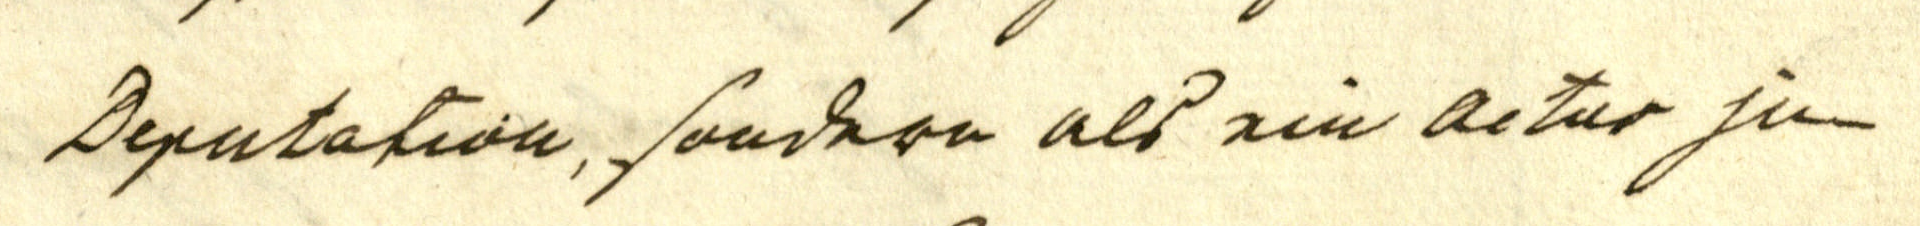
Deputation, sondern als ein Actus ju¬
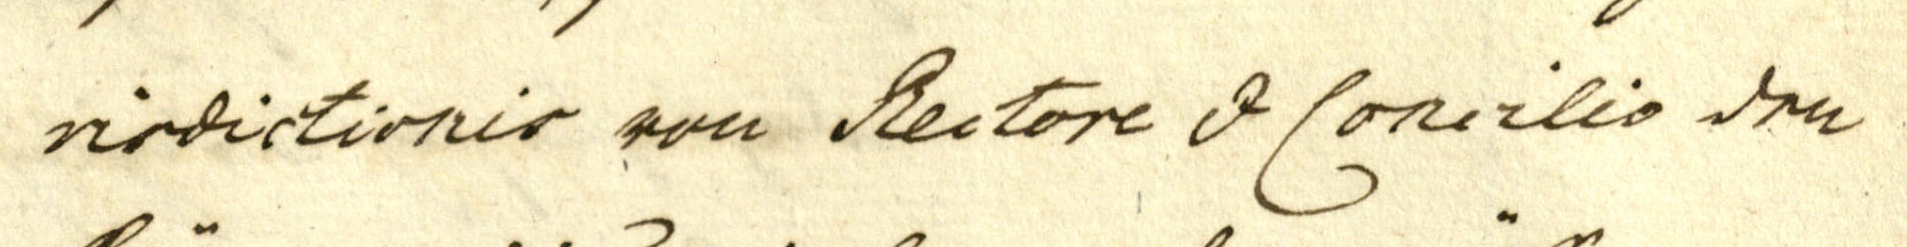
risdictionis von Rectore et Concilio den
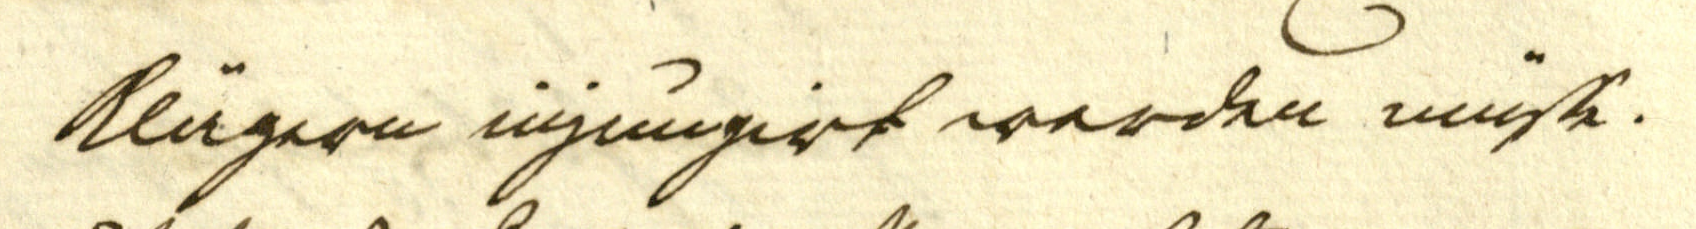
Klägern injungirt werden müsse.
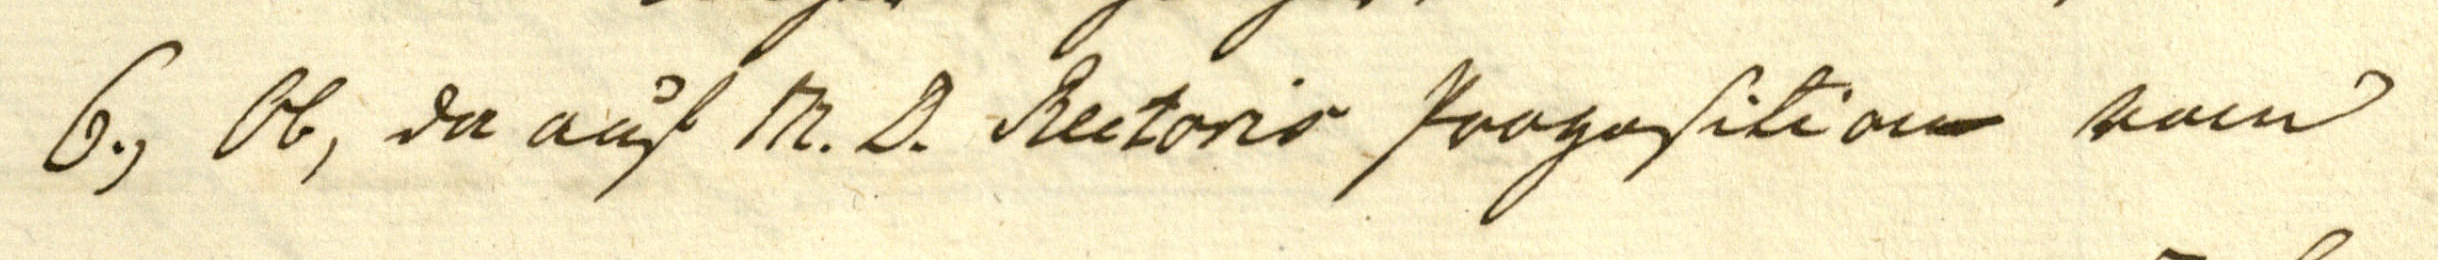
6., Ob, da auf M. D. Rectoris Proposition vom
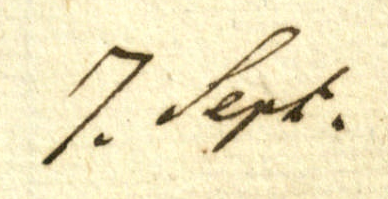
7. Sept.
